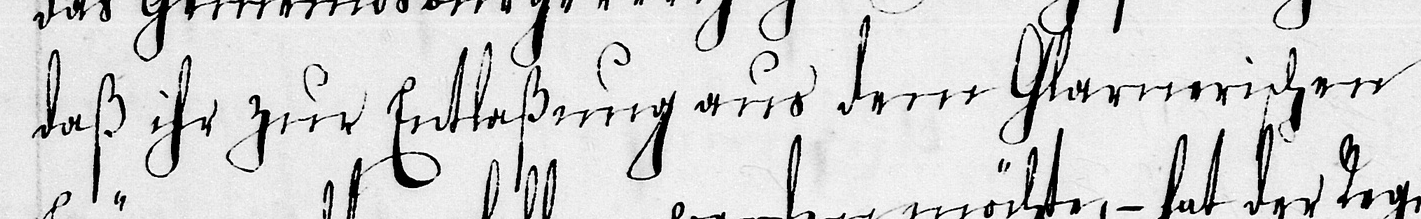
daß ihr zur Entlaßung aus dem Glarnerischen
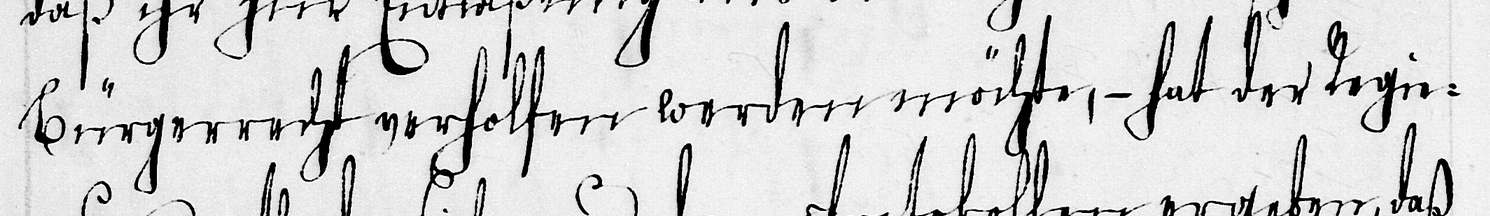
Bürgerrecht verholfen werden möchte, – hat der Regie¬
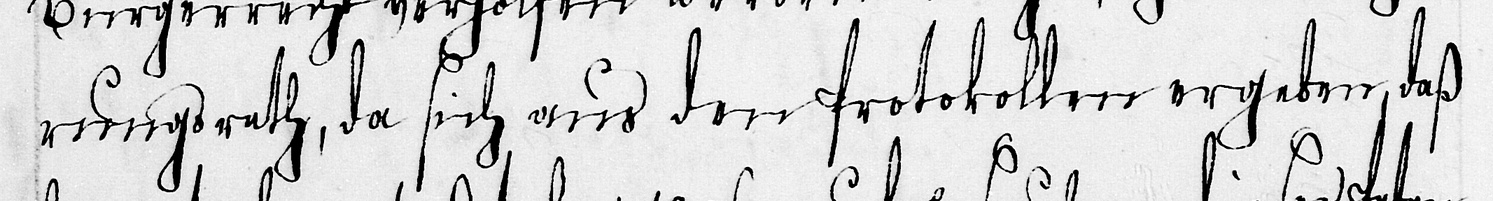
rungsrath, da sich aus den Protokollen ergeben, daß
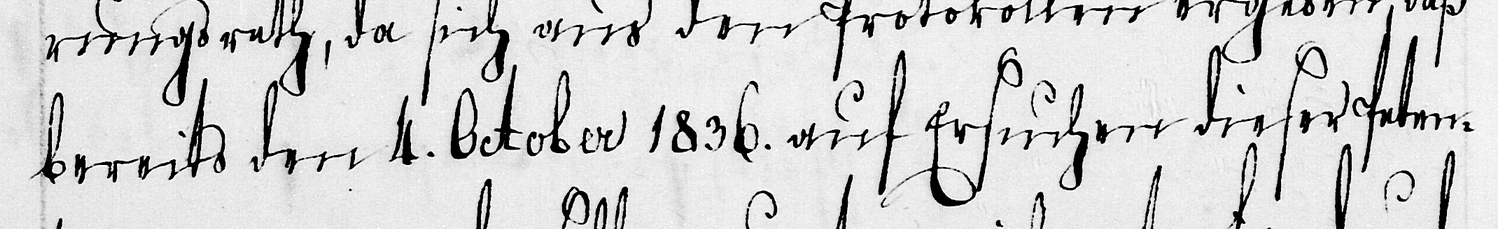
bereits den 4. October 1836. auf Ersuchen dieser Peten¬
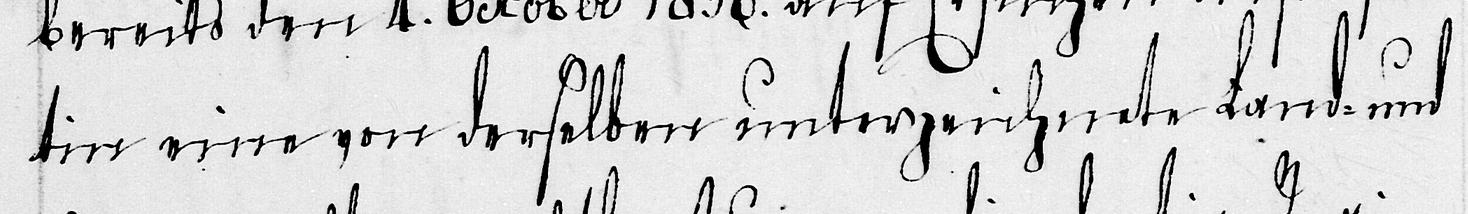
tin eine von derselben unterzeichnete Land- und
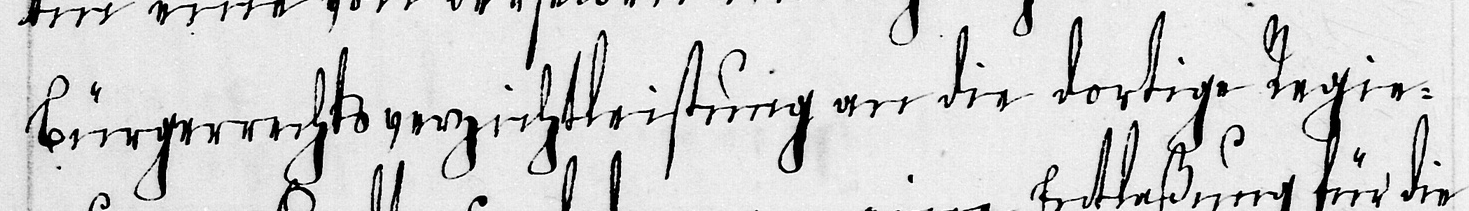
Bürgerrechtsverzichtleistung an die dortige Regie¬
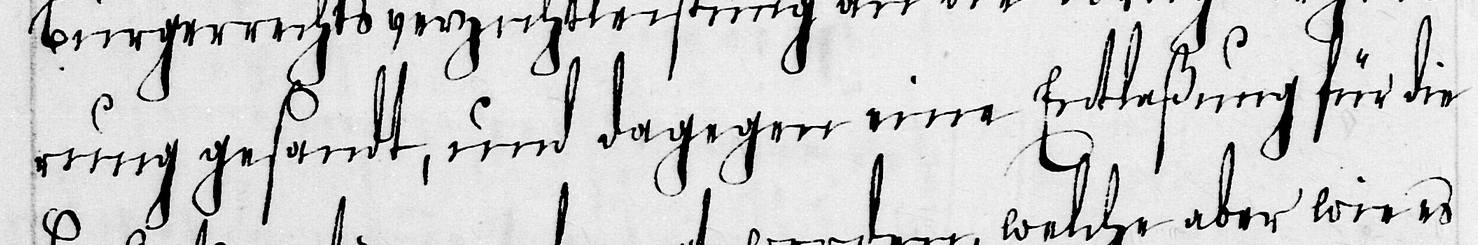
rung gesandt, und dagegen eine Entlaßung für die
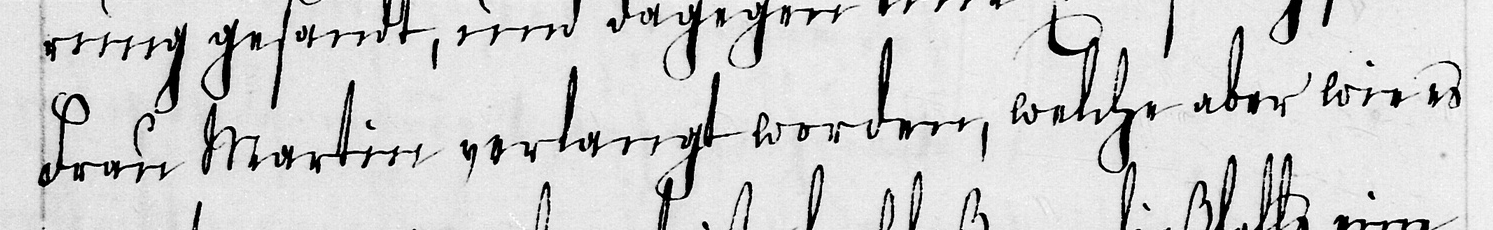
Frau Martin verlangt worden, welche aber wie es
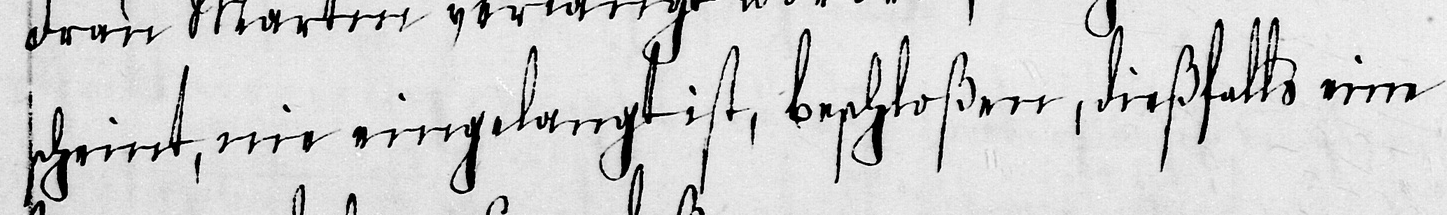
scheint, nie eingelangt ist, beschloßen, diesfalls eine
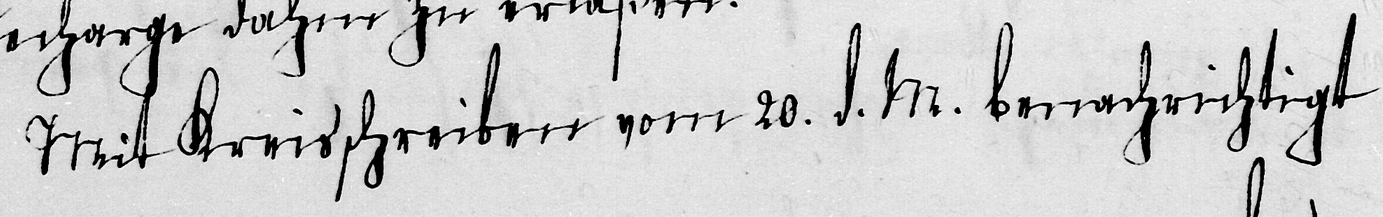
Mit Kreisschreiben vom 20. d. M. benachrichtigt
